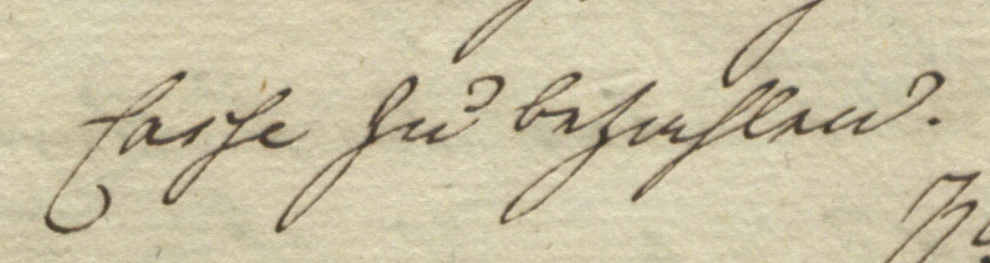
Casse zu bezahlen.
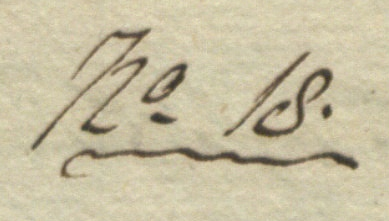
No 18.
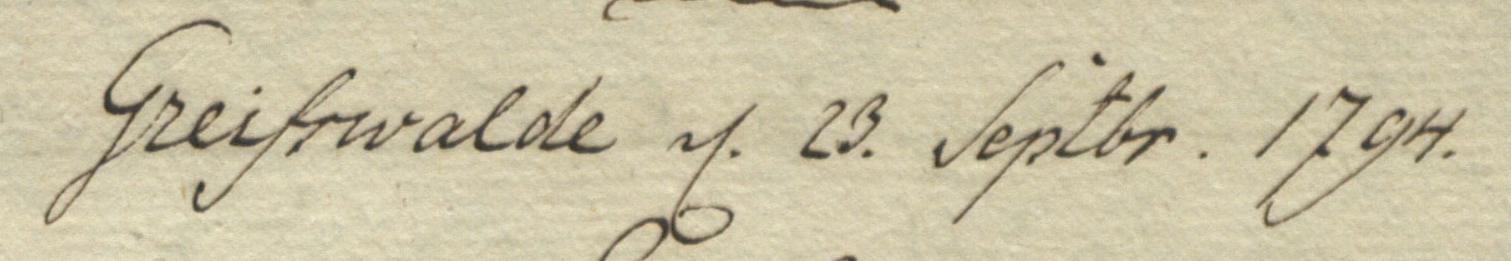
Greifswalde d. 23. Septbr. 1794..
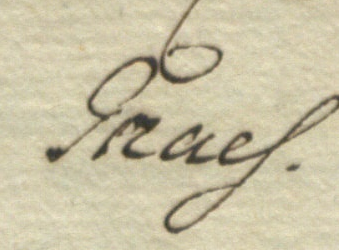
Praes.
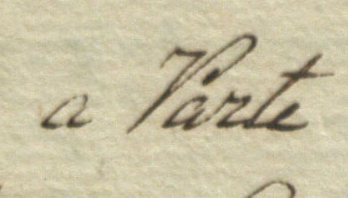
a Parte
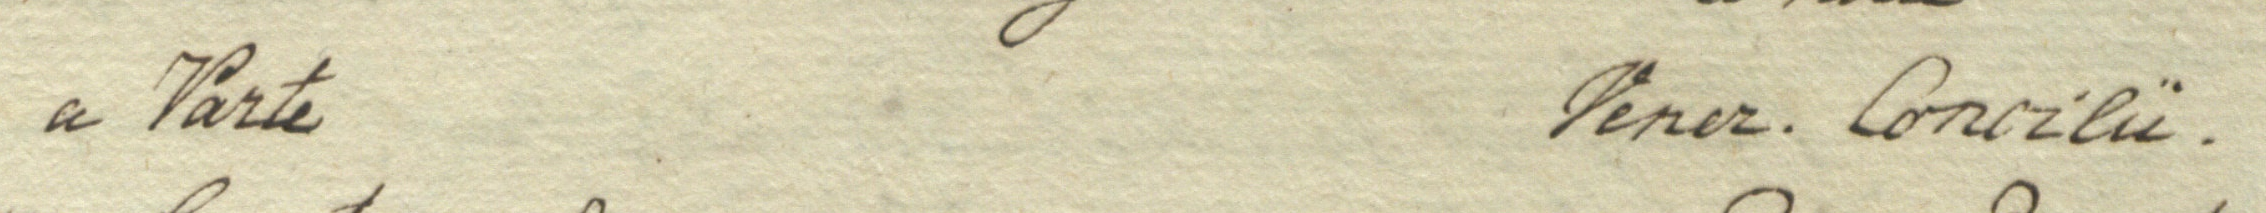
a Parte Vener. Concilii.
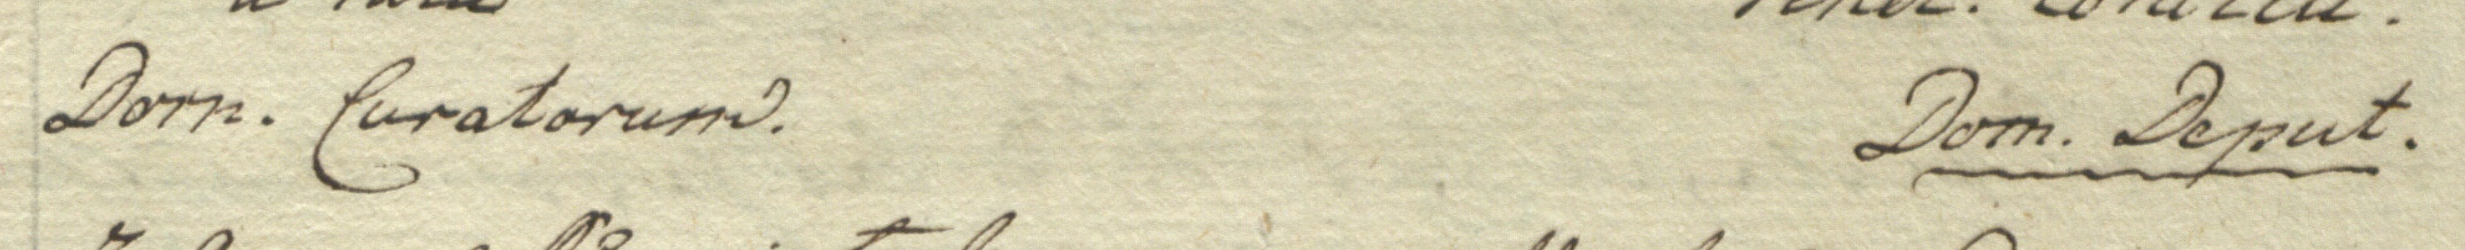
Dom. Curatorum. Dom. Deput.
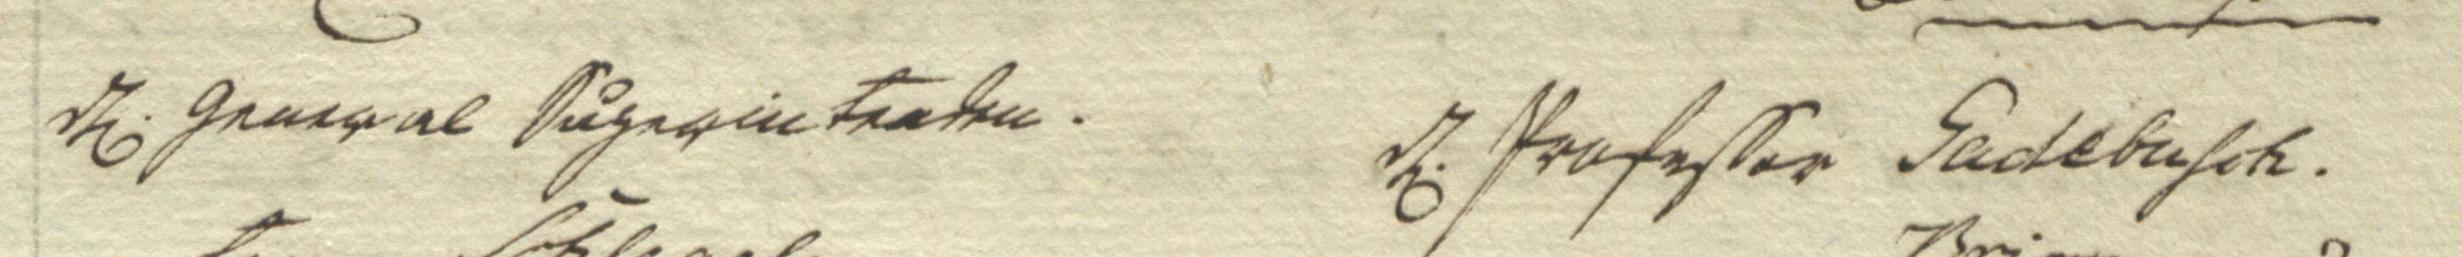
dh. General Superintenden¬ dh. Professor Gadebusch.
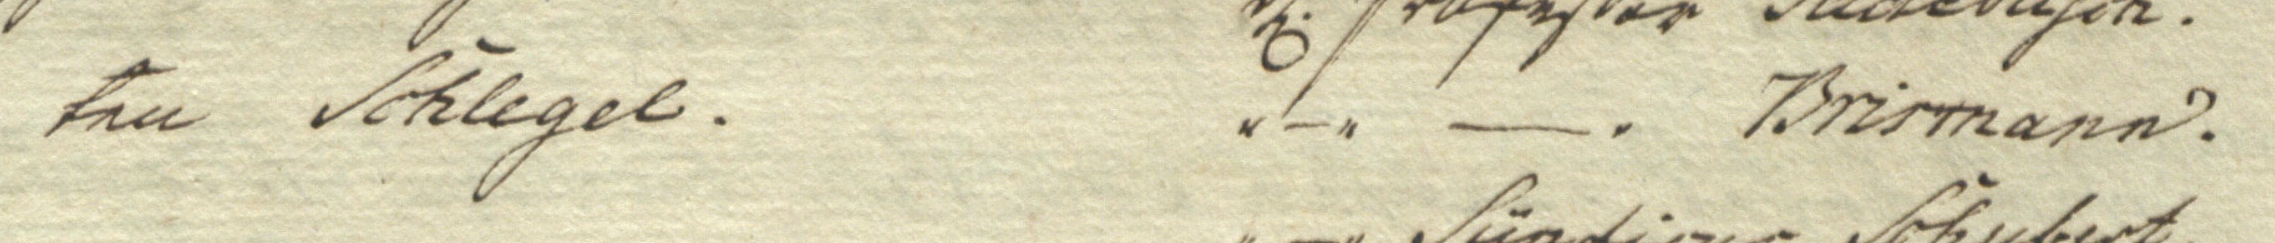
ten Schlegel. Brismann.
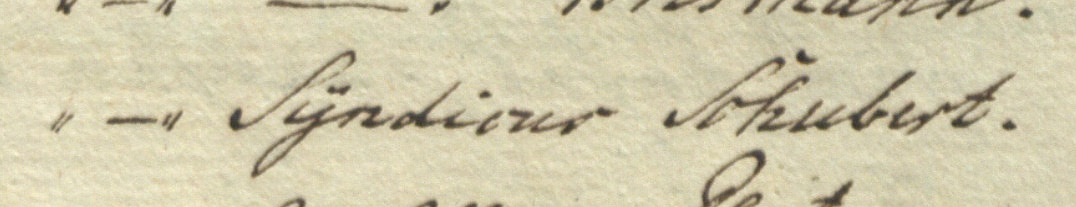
Sÿndicus Schubert.
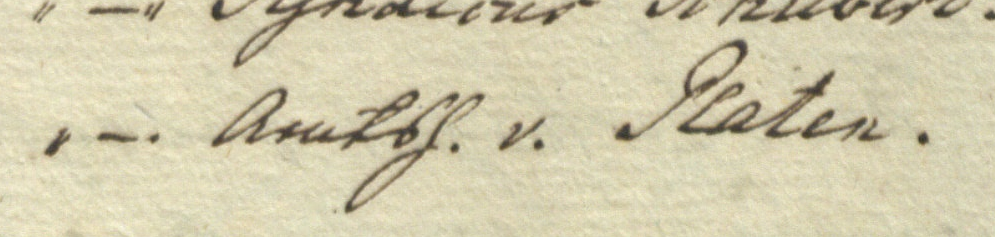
Amtsh. v. Platen.
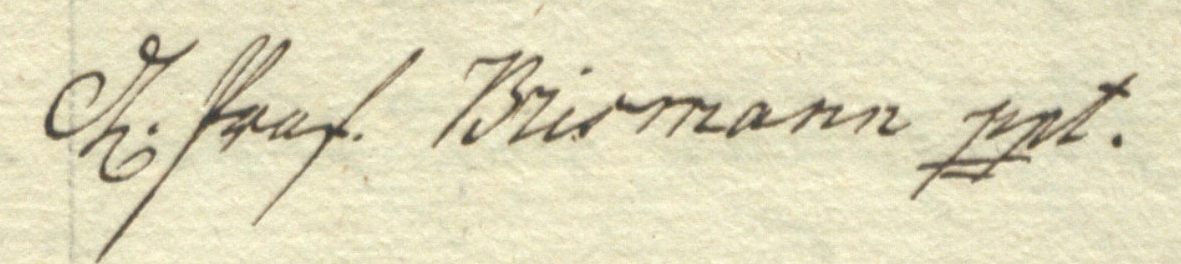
dh. Prof. Brismann ppt.
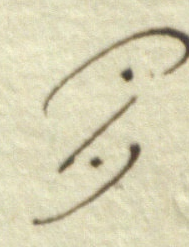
1.,
